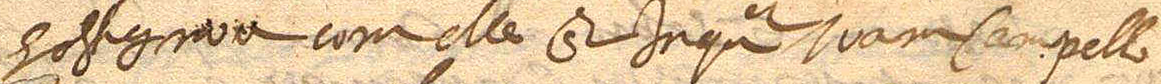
E assignou com elle sor Jnquor Joam Campello
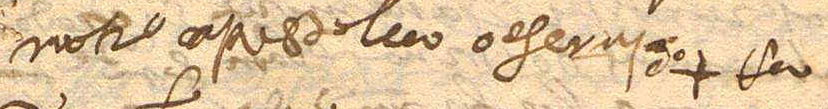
notro apostolico o escruj
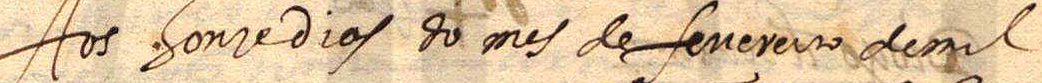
Aos honze dias do mes de feuereiro de mil
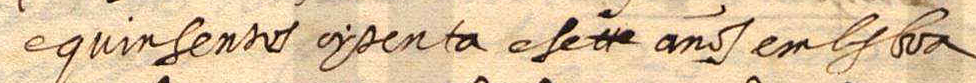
e quinhentos oytenta e sette anos em lisboa
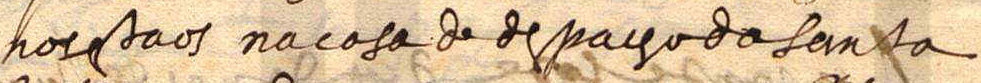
nos estaos na casa do despacho da santa
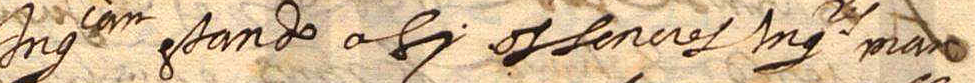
Inqcam estando ahy os senores Inq.res man
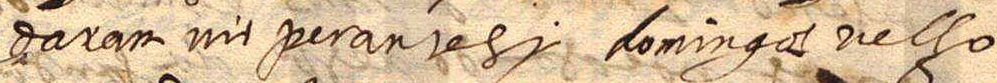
daram uir perante sy domingos uelho
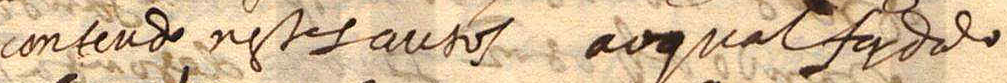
conteudo nestes autos ao qual foy dado
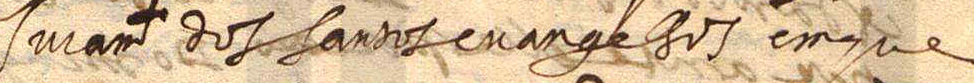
Juramto dos santos euangelhos em que
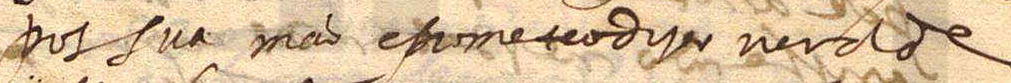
pos sua maõ e prometeo dizer uerdade
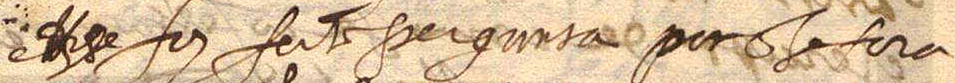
e dise foj feito pergunta porq̄ se fora
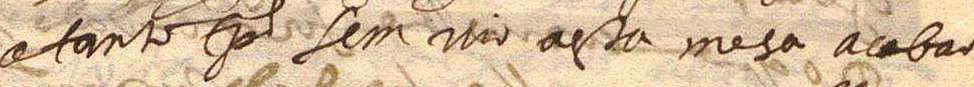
a tanto tpo sem uir a esta mesa acabar
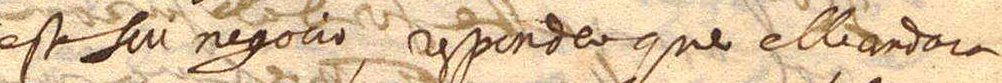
este seu negocio, respondeo que elle andara
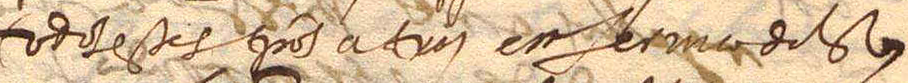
todos estes tpōs atras em seruico del Rej
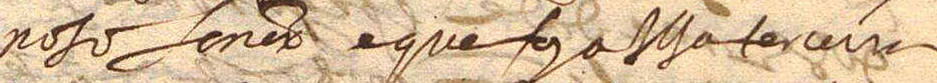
noso Senor̄ e que foj a Jlha terceira
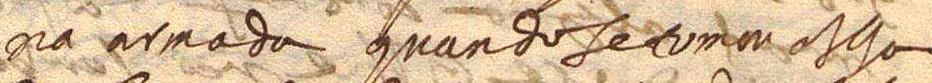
na armada quando se tomou a Jlha
